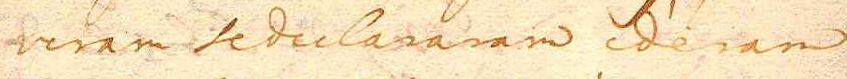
veram se declararam e deram
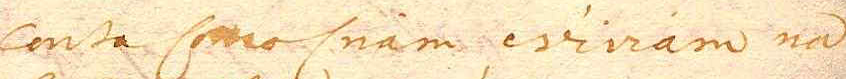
conta Como Criam, e viviam na
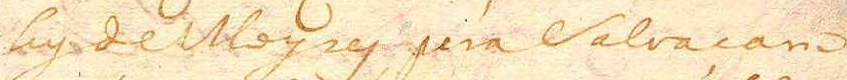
ley de Moyzes, pera Salvaçam
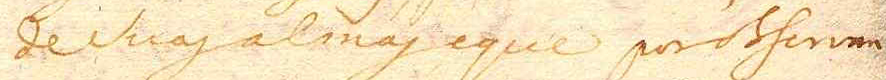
de Suas almas e que por observan
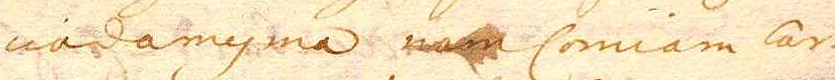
cia da mesma, nam Comiam car
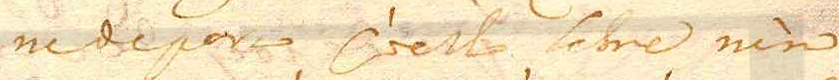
ne de porco, Coelho, lebre, ném
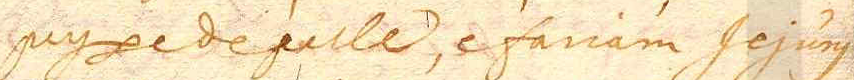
peyxe de pelle, e faziam Jejūns
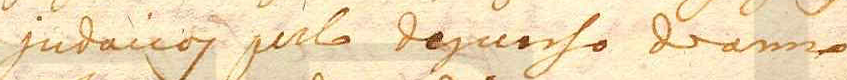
judaicos pello descurso do anno
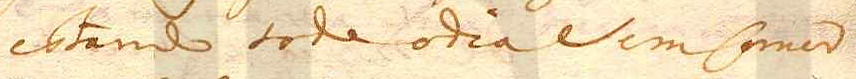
estando todo o dia Sem Comer
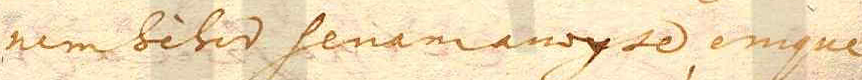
nem beber senam a noyte, em que
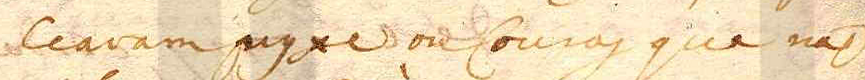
Ceavam peyxe ou Couzas que naõ
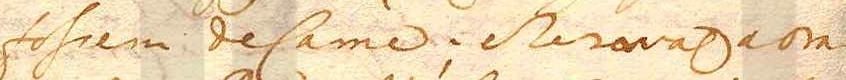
fossem de Carne; e rezavaõ a ora
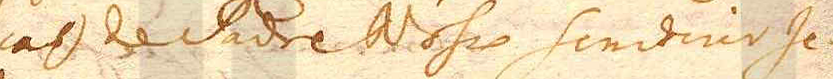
çaõ de Padre Nosso sem dizer Je
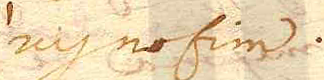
zus no fim.
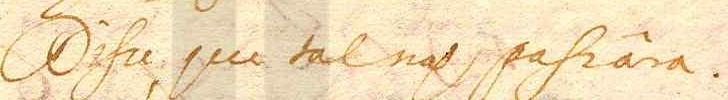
Disse que tal naõ passára.
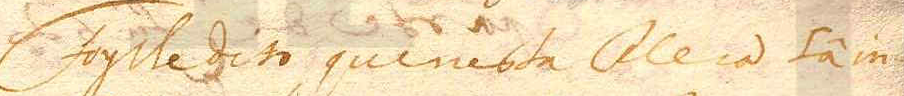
Foylhe dito, que nesta Meza hâ in
